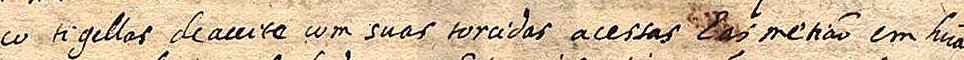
co tigellas de aceite com suas torcidas acessas E as metiaõ em huā
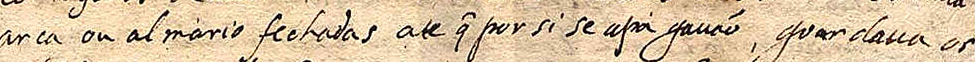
arca ou almario fechadas ate q̄ por si se apagauaõ, goardaua os
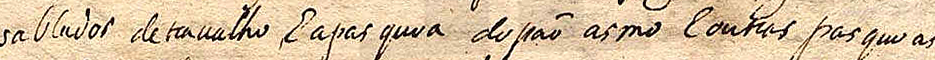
sabbados de traualho, e E a pasquoa do paõ asmo E outras pasquoas
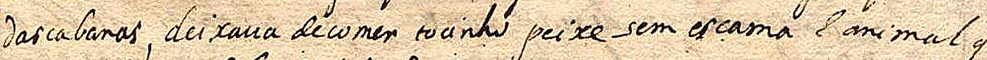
das cabanas, deixaua de comer tocinho peixe sem escama E animal q̄
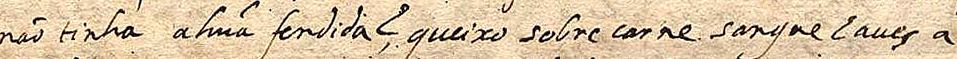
naõ tinha a huā fendida E queixo sobre carne sangue E aues a
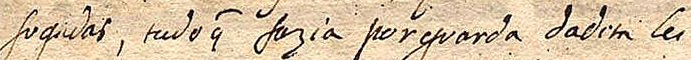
fogadas, tudo q̄ fazia por guarda da dita lei
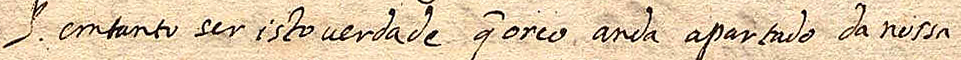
P. em tanto ser isto uerdade q̄ o reo anda apartado da nossa
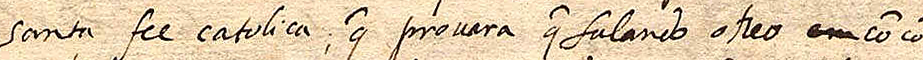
santa fee catolica; q̄ prouara q̄ falando o Reo em cō cō
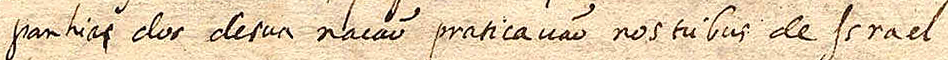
panhias dos de sua nacaõ patricauaõ nos tribus de Jsrael
